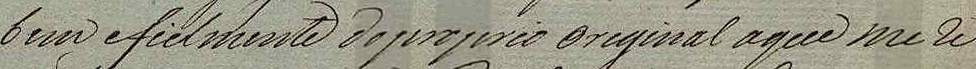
bem e fielmente do proprio oreginal a que me Re
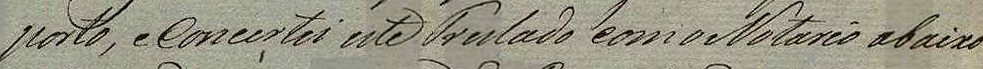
porto, e Concertei este Treslado com o Notario abaixo
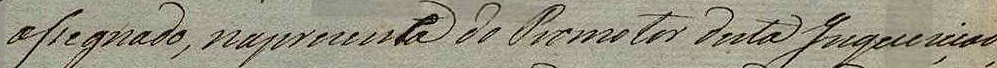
assegnado, na presenCa do Promotor desta Jnnquisiçaõ,
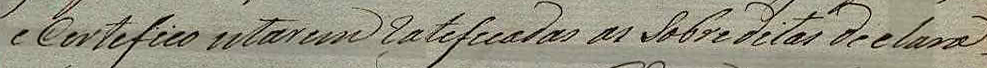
e Certifico estarem Rateficadas as Sobreditas declara
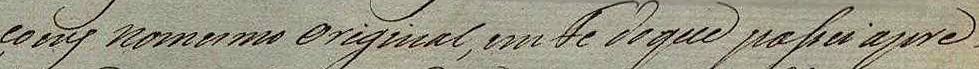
çoens no mesmo original, em Fe de que passei a pre
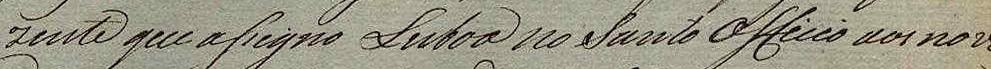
zente que assigno Lisboa no Santo Officio aos nove
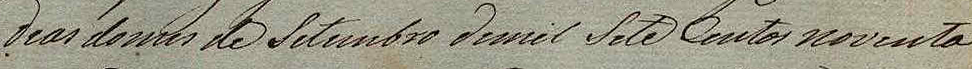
dias do mes de Setembro de mil SeteCentos noventa
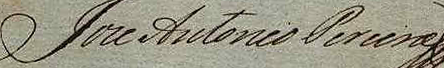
Joze Antonio Pereira
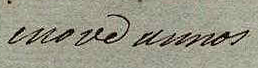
e nove annos.
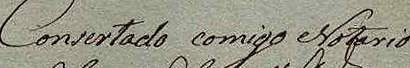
Consertado comigo Notario
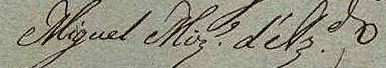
Miguel Miz̄. d'Az.do
